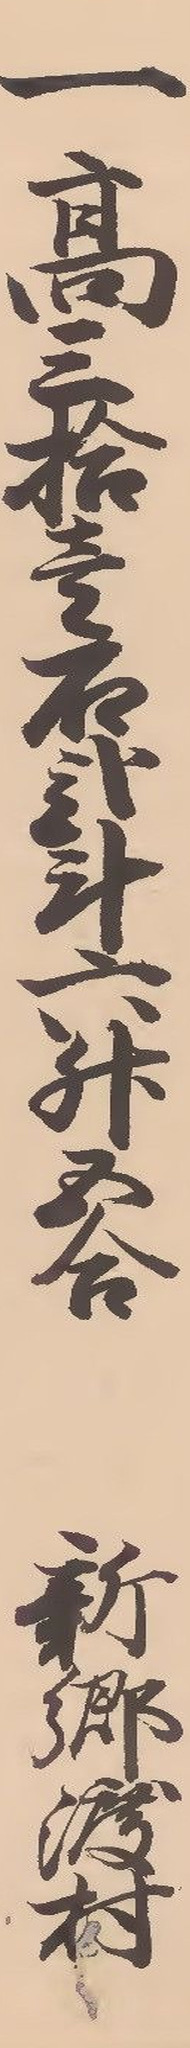一高三拾壱石弐斗六升五合新郷渡村
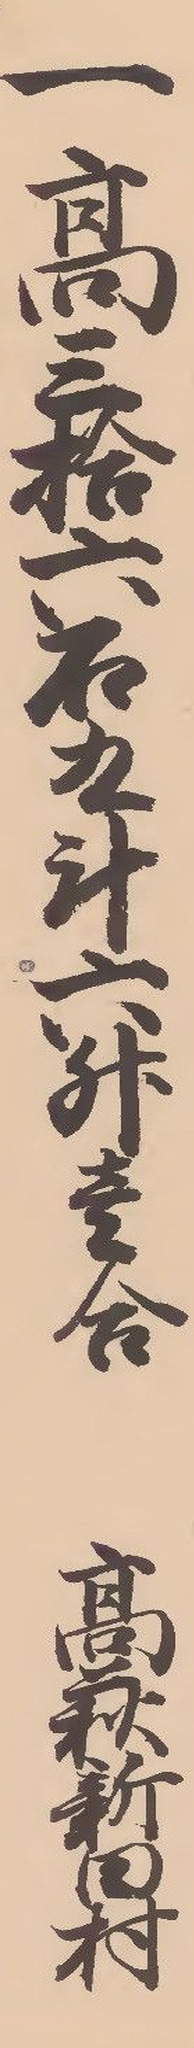一高三拾六石九斗六升壱合高萩新田村

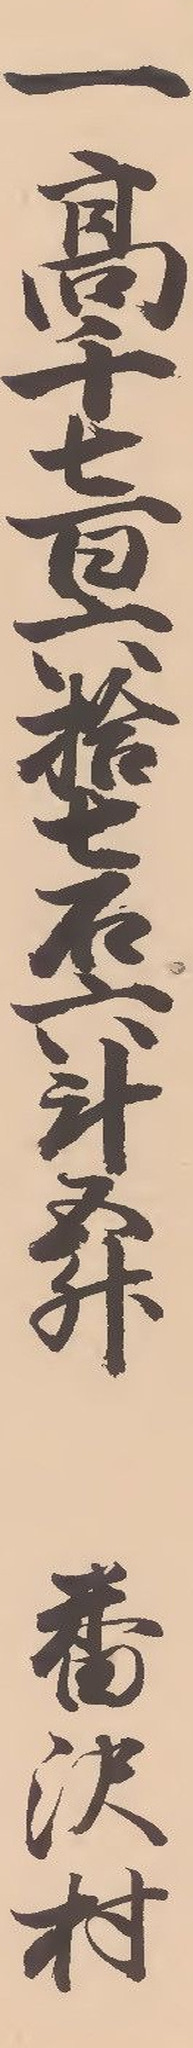一高千七百六拾七石六斗五升番沢村
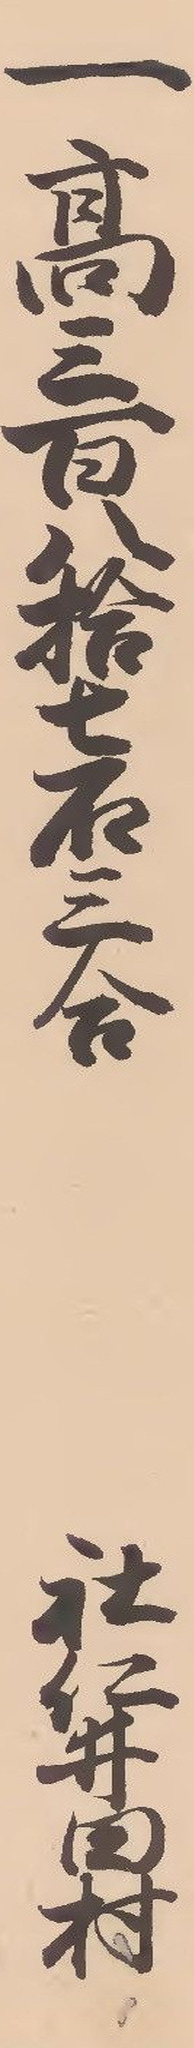一高三百八拾七石三合社仁井田村
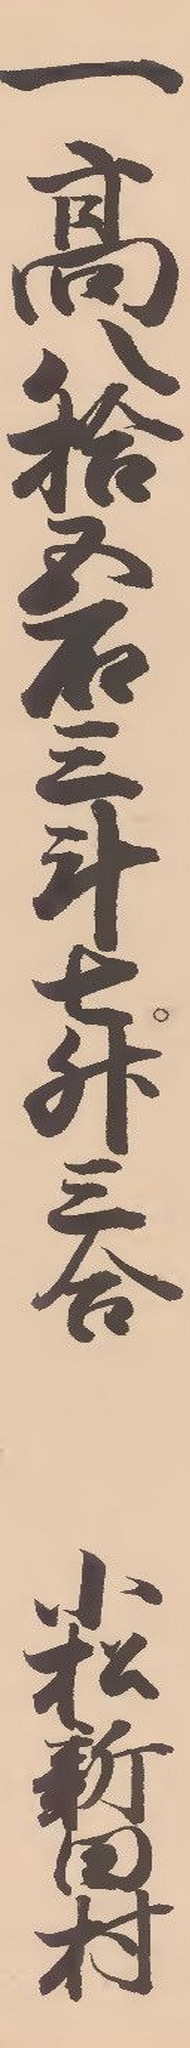一高八拾五石三斗七升三合小松新田村
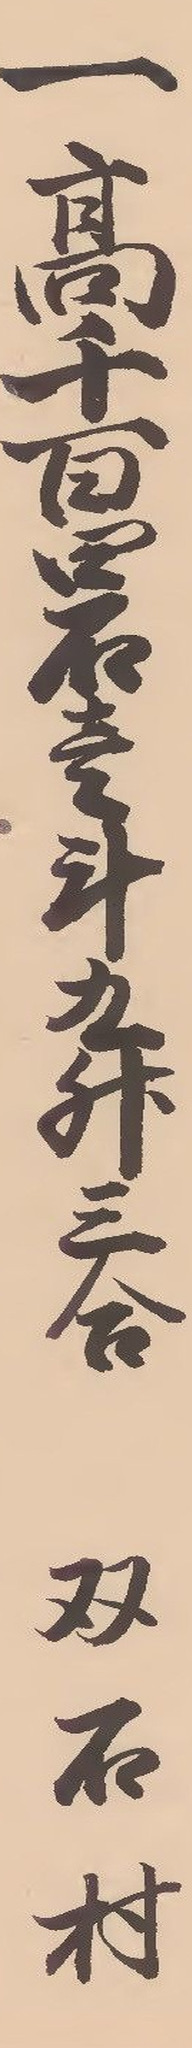一高千百四石壱斗九升三合双石村
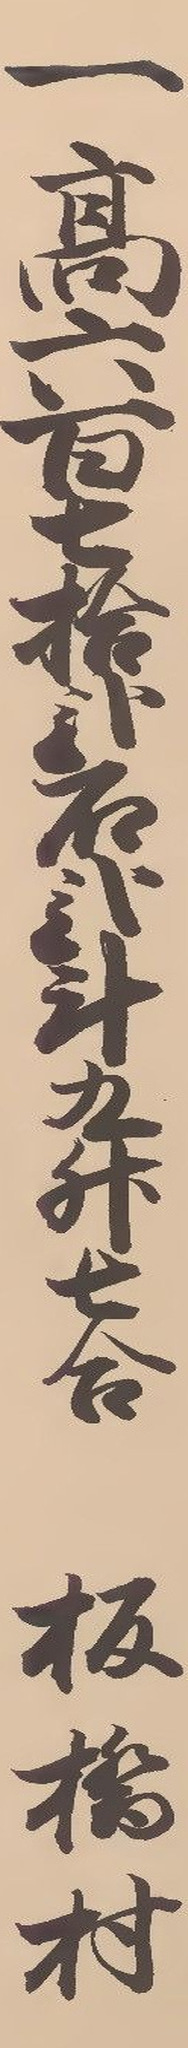一高六百七拾弐石弐斗九升七合板橋村
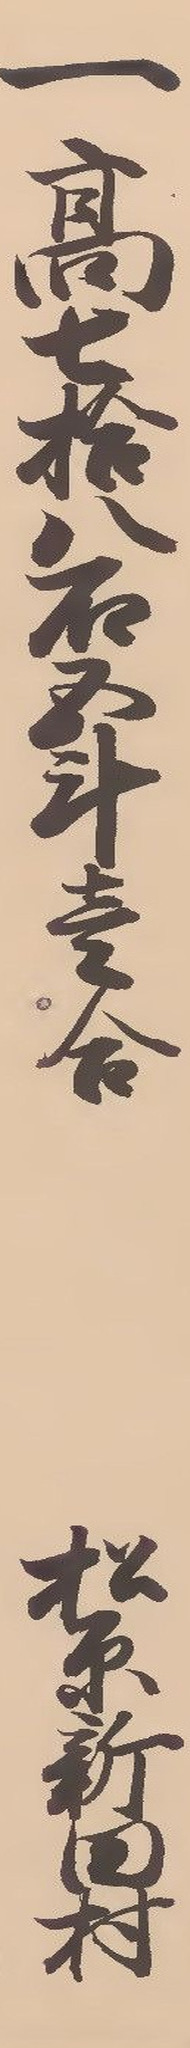一高七拾八石五斗壱合松原新田村
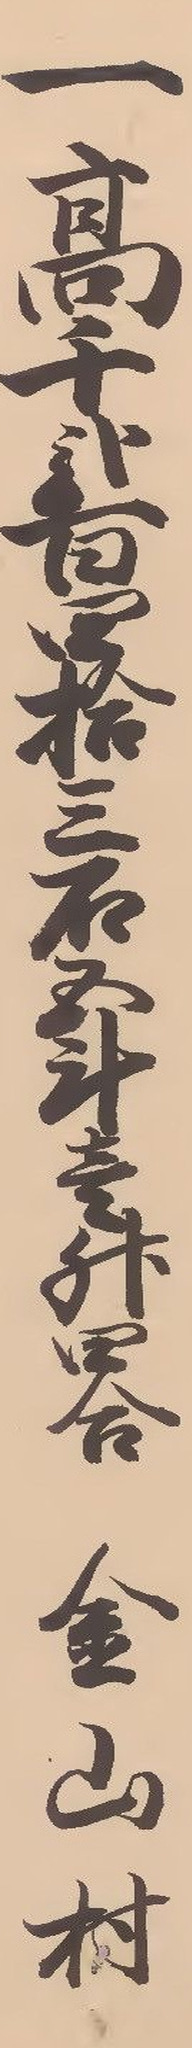一高千弐百四拾三石五斗壱升四合金山村
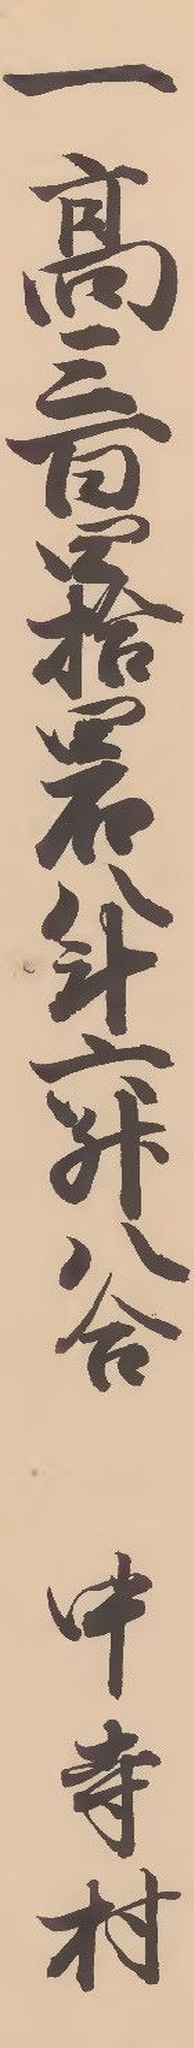一高三百四拾四石八斗六升八合中寺村

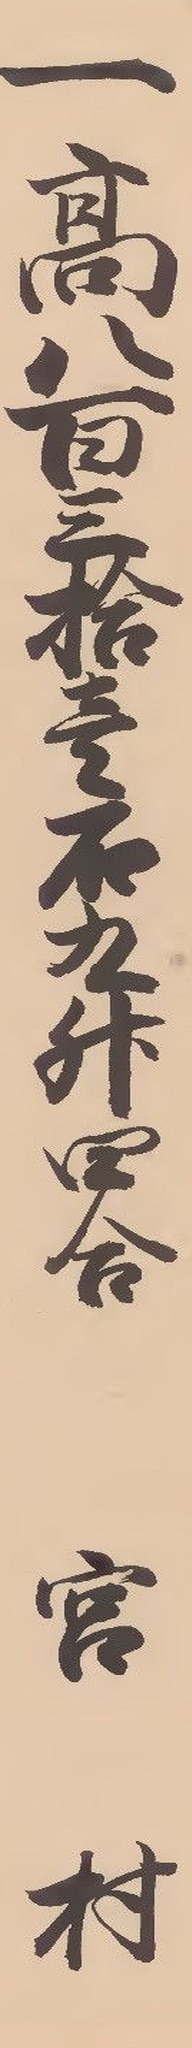一高八百三拾壱石九升四合宮村
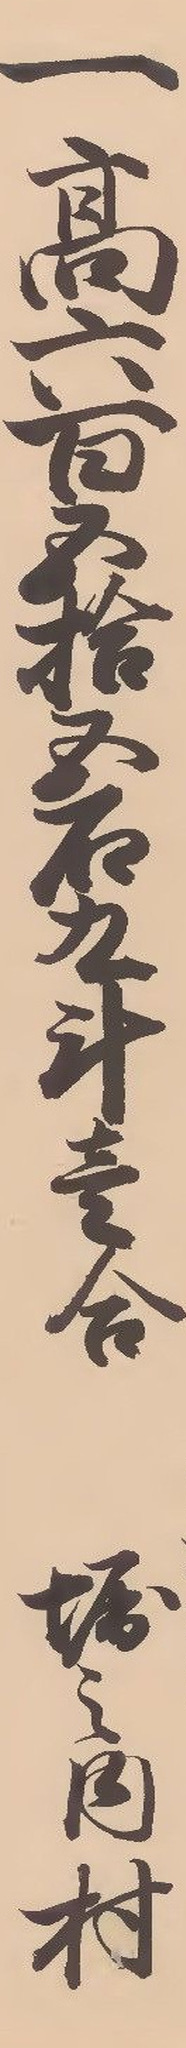一高六百五拾五石九斗壱合堀之内村
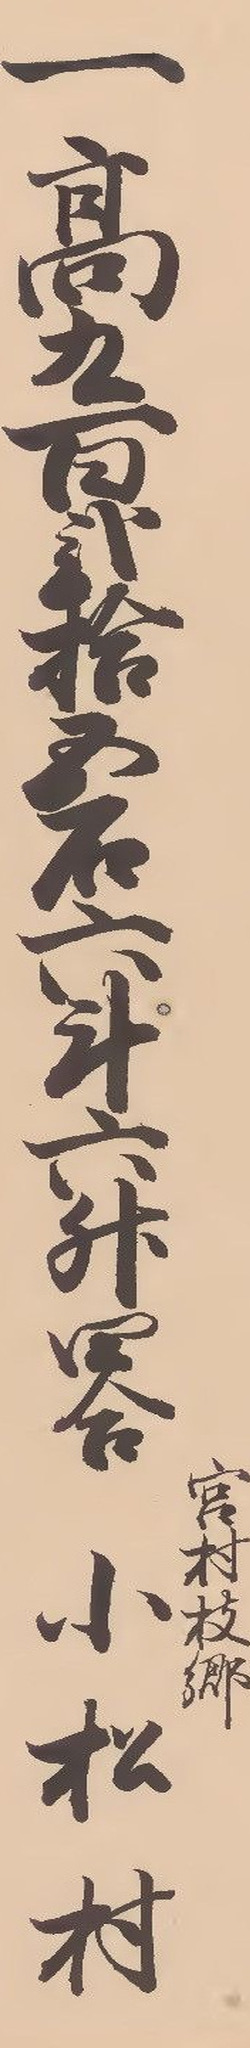一高九百弐拾五石六斗六升四合小松村
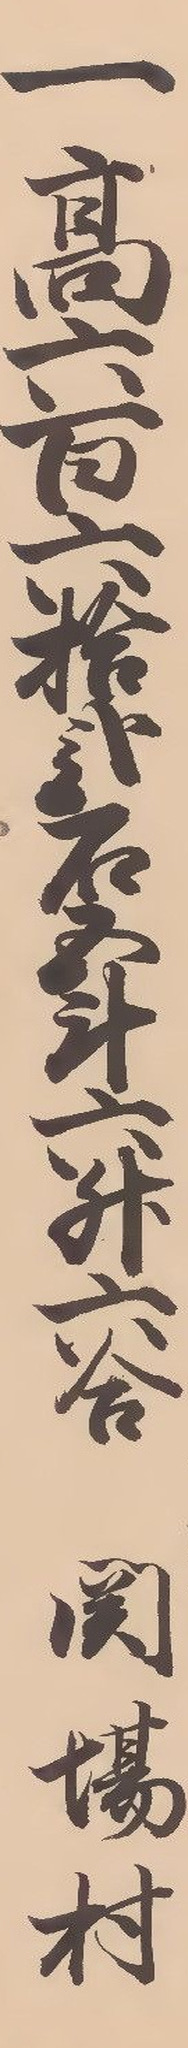一高六百六拾弐石五斗六升六合関場村
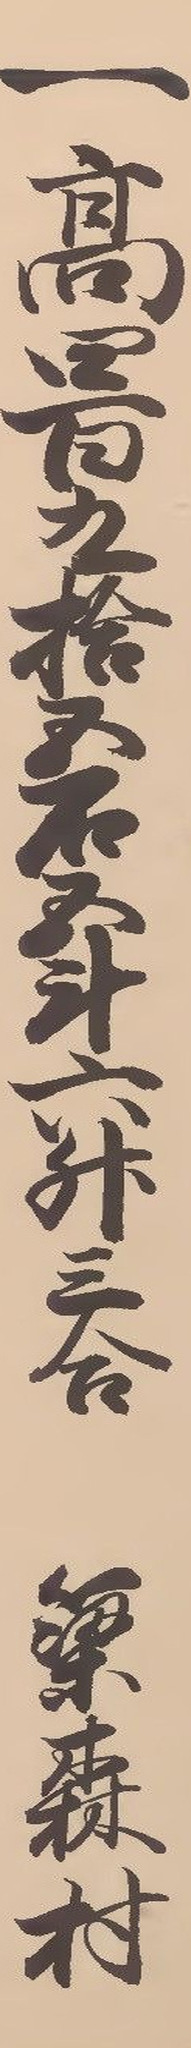一高四百九拾五石五斗六升三合簗森村
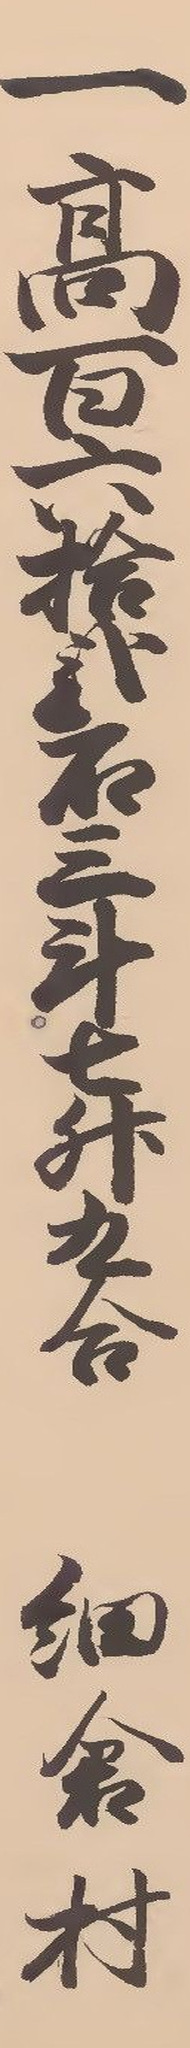一高百六拾弐石三斗七升九合細倉村
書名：陸奥国郷帳　２
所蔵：国立公文書館 National Archives of Japan
